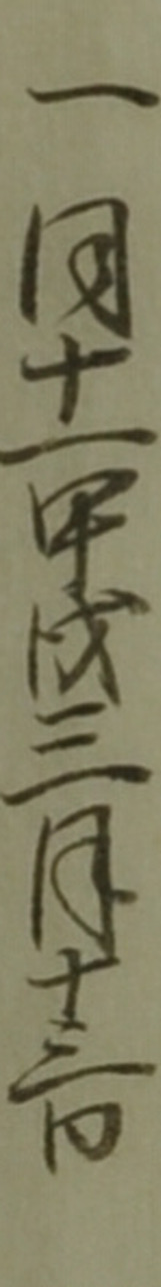一同十一甲戌三月十三日
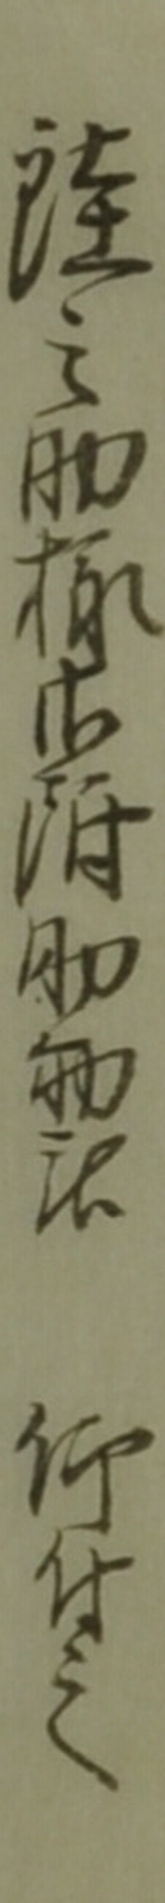銈之助様御附助勤被仰付之
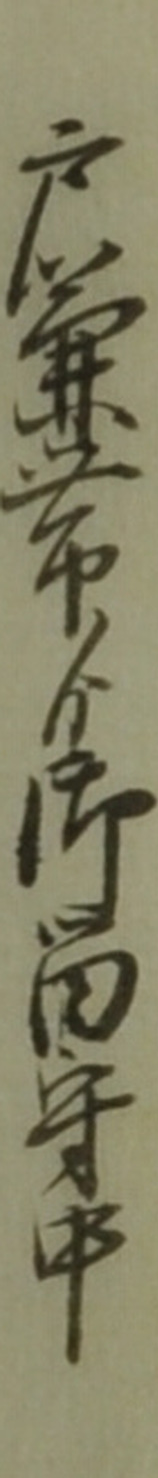戸兼帯ゟ御留守中
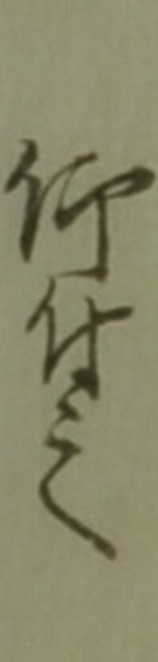仰付之
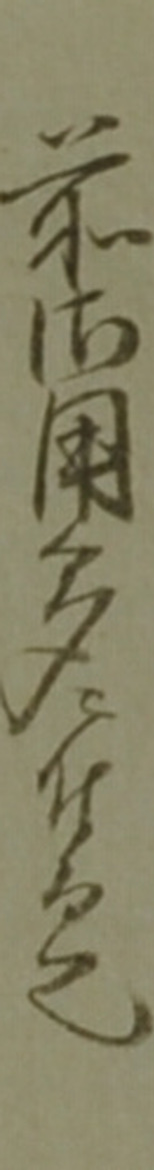前御用多ニ付而也
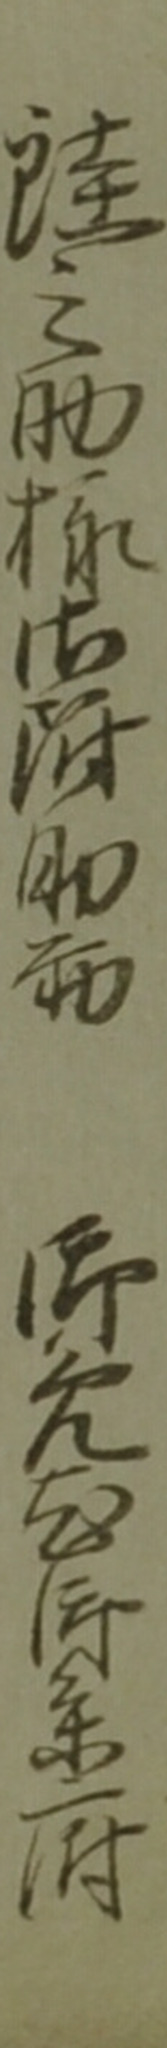銈之助様御附助勤御免尤御参府
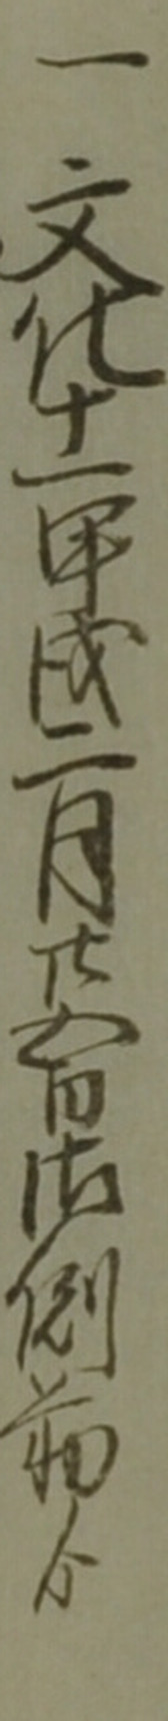一文化十一甲戌二月廿五日御側勤ゟ
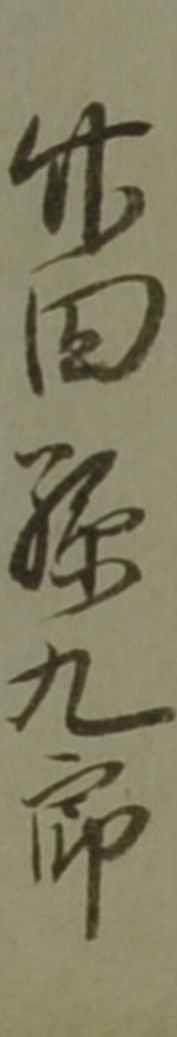竹田孫九郎
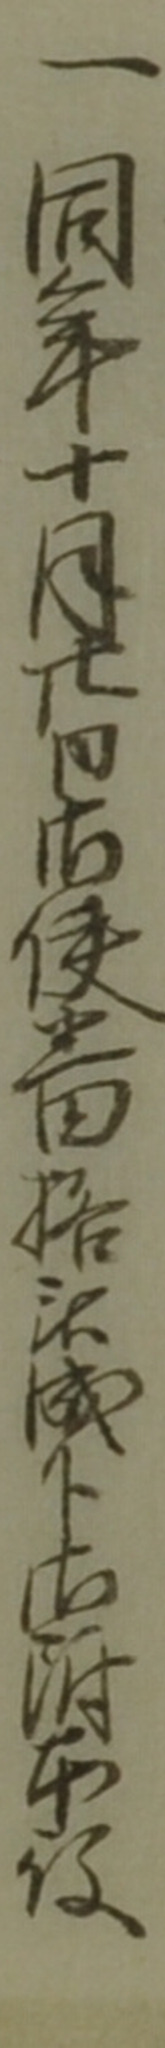一同年十月廿日御使番格被成下御附本役
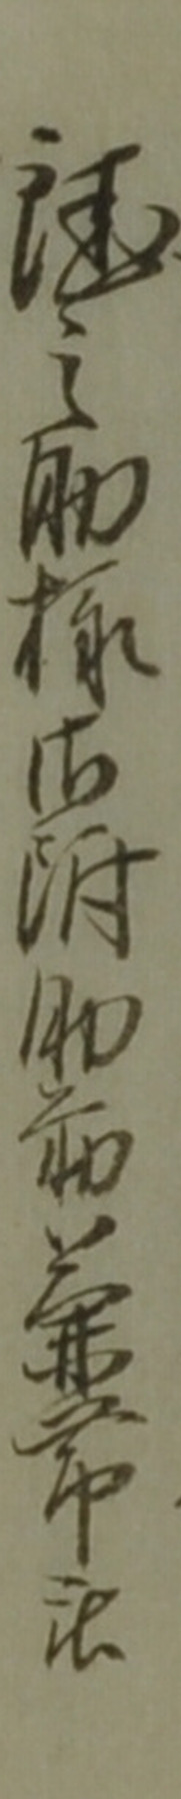銈之助様御附助勤兼帯被
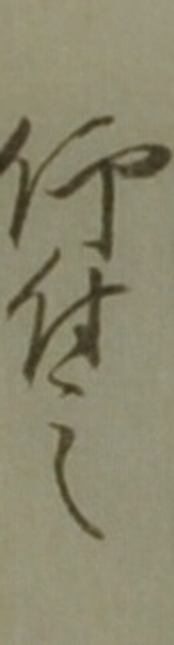仰付之
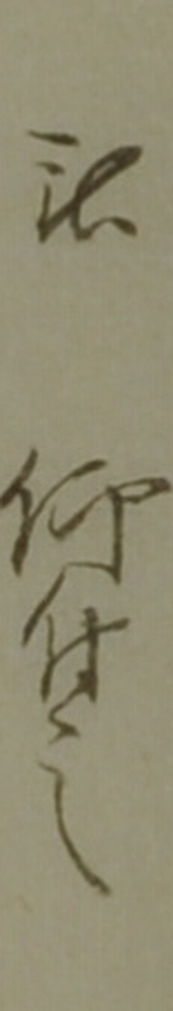被仰付之
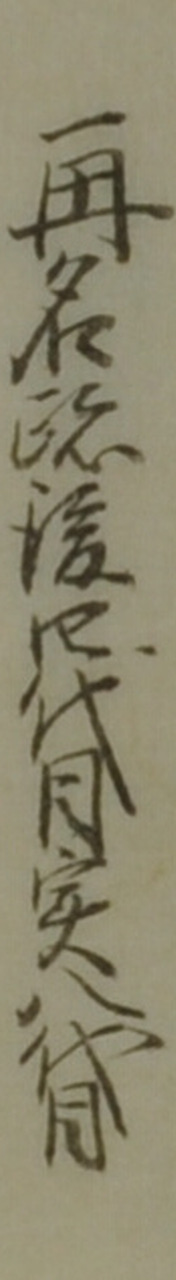再名跡後四代目実八代目
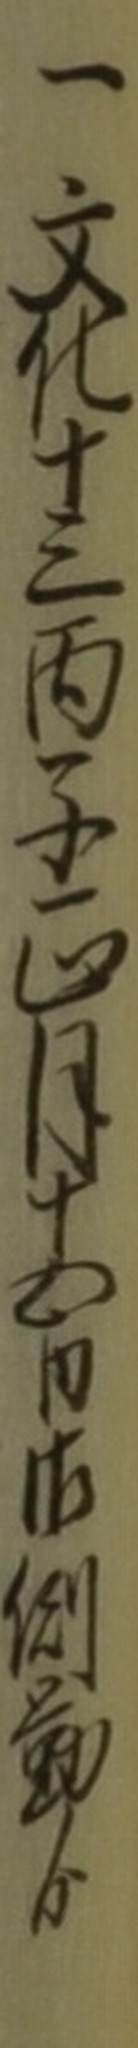一文化十三丙子正月十五日御側勤ゟ
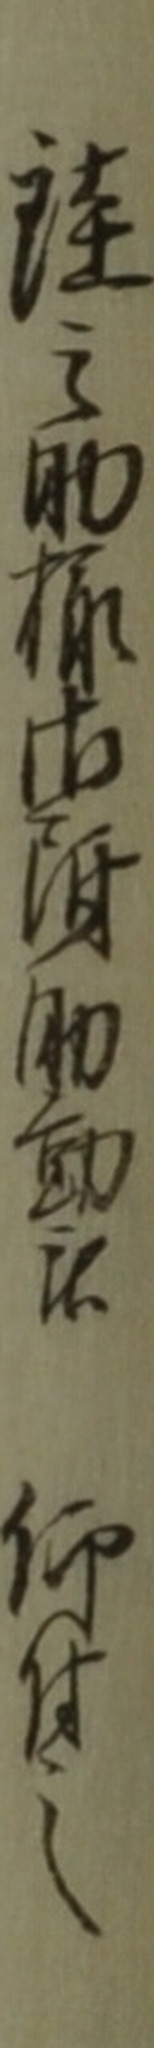銈之助様御附助勤被仰付之
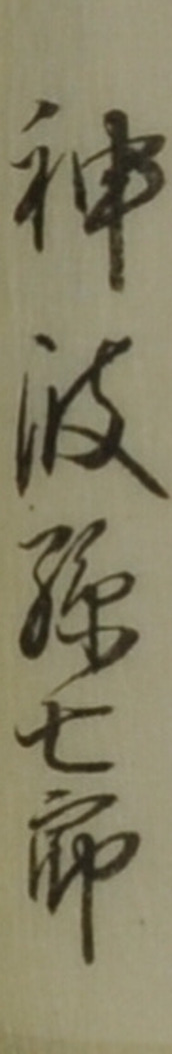神波孫七郎
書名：諸御役代々録（六）
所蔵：伊那市立高遠町図書館・合同会社AMANE
